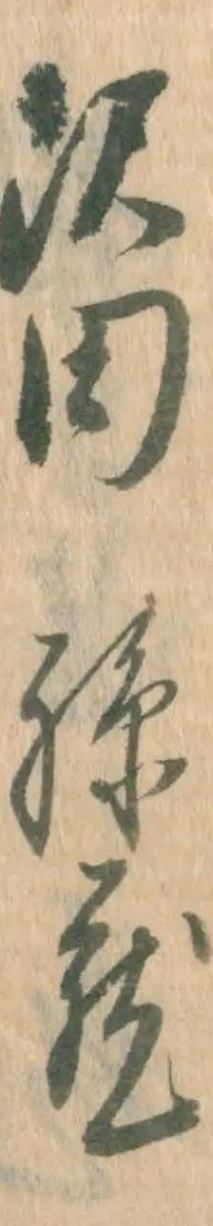沢田孫蔵
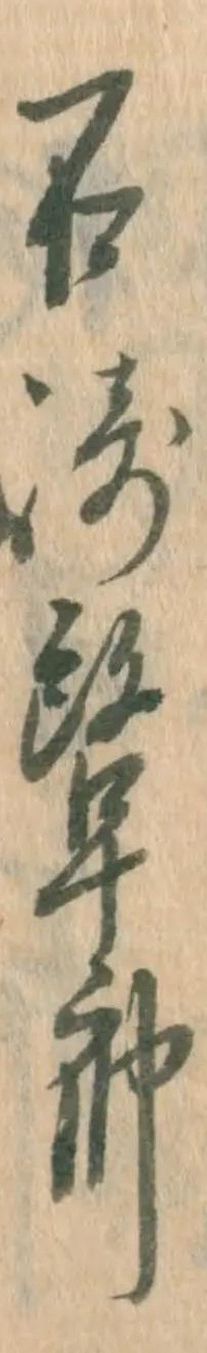石崎啓十郎
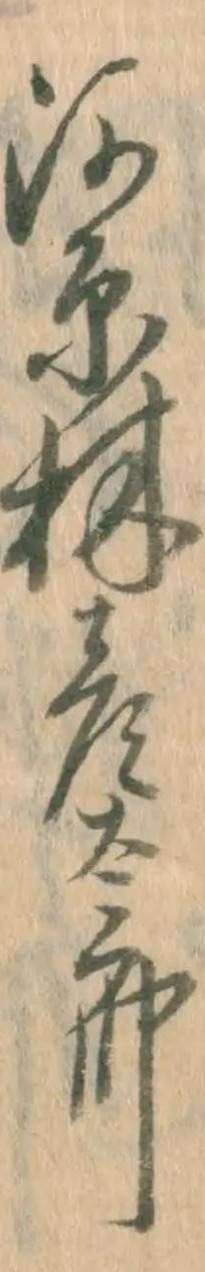河原林彦太郎
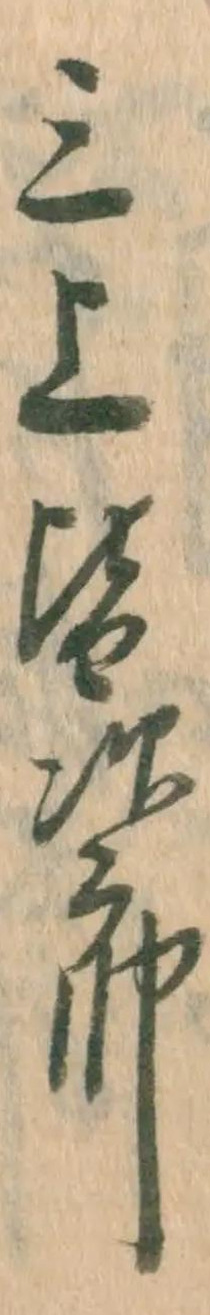三上皆次郎
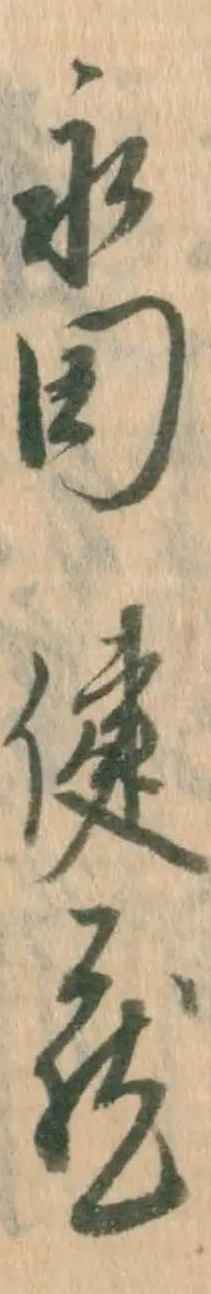永田健蔵
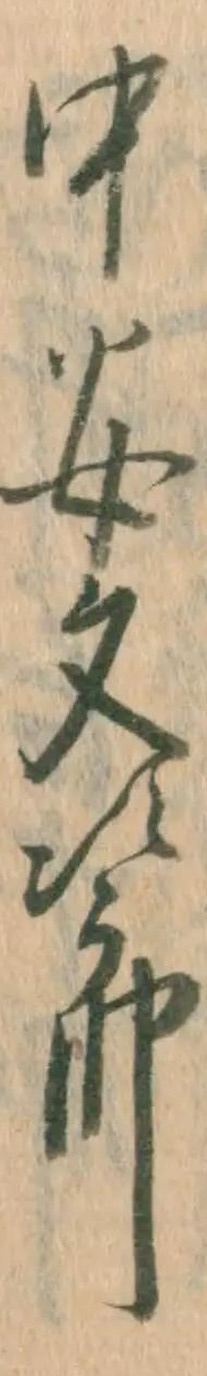中安文次郎
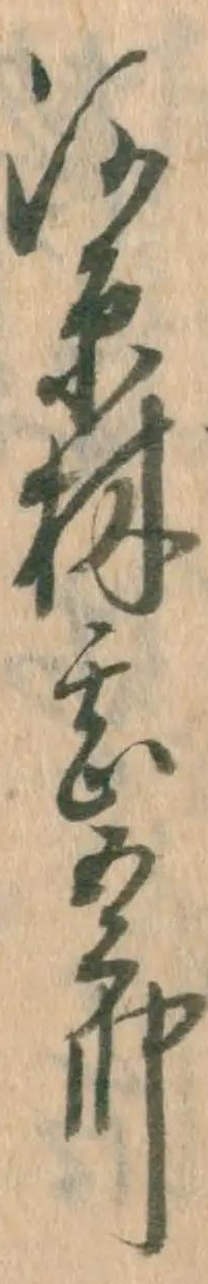河原林甚五郎
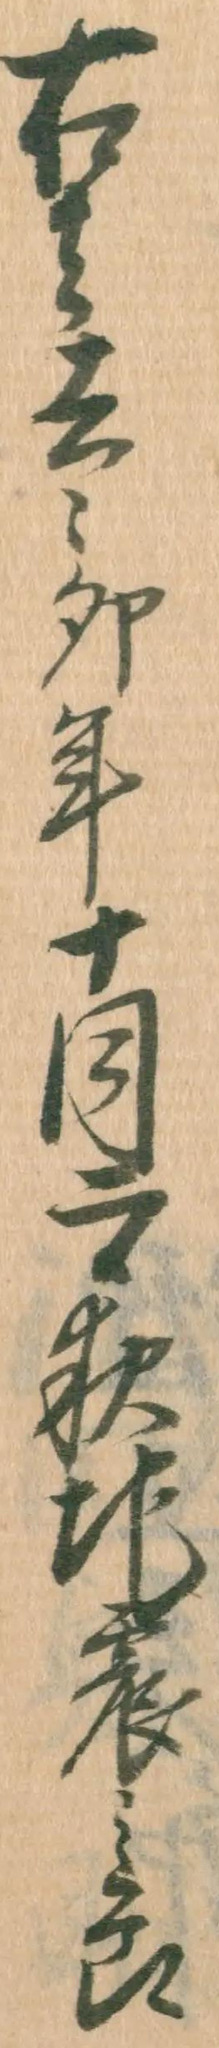右は去〻卯年十月二日夜地震之節
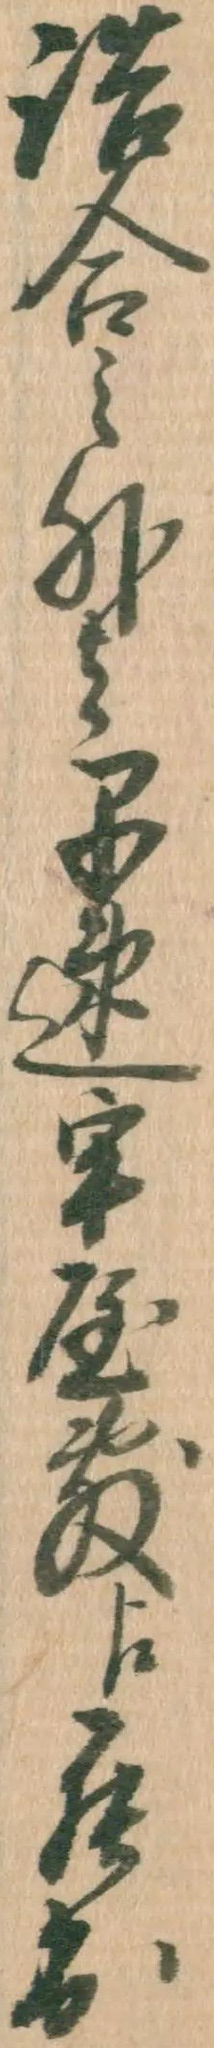詰合之外は早速牢屋敷え罷出
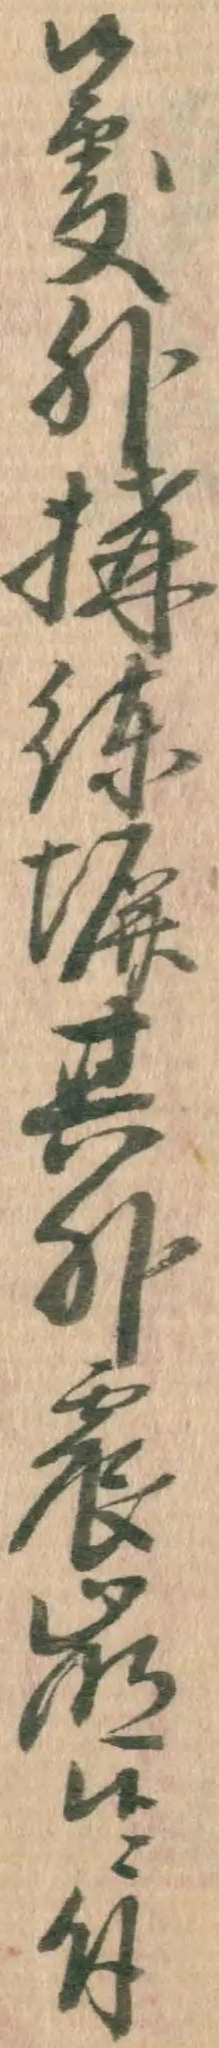候処外構煉塀其外震崩候ニ付
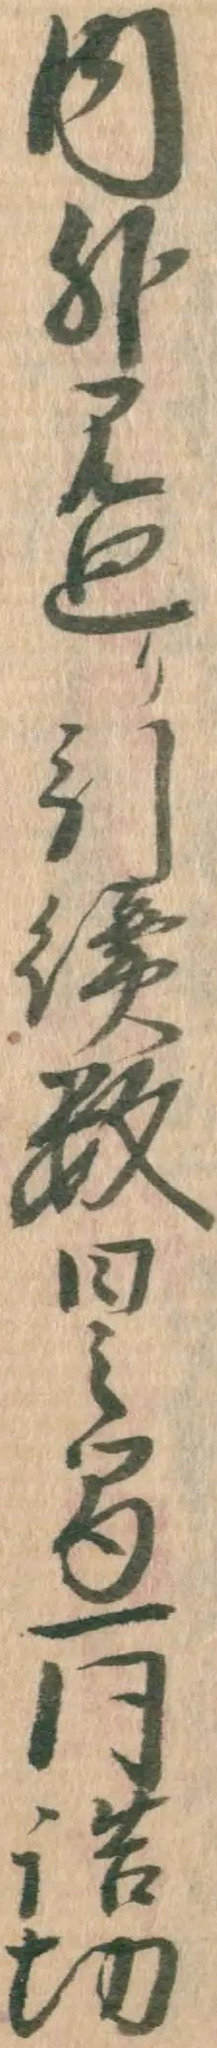内外見廻り引続数日之間一同詰切
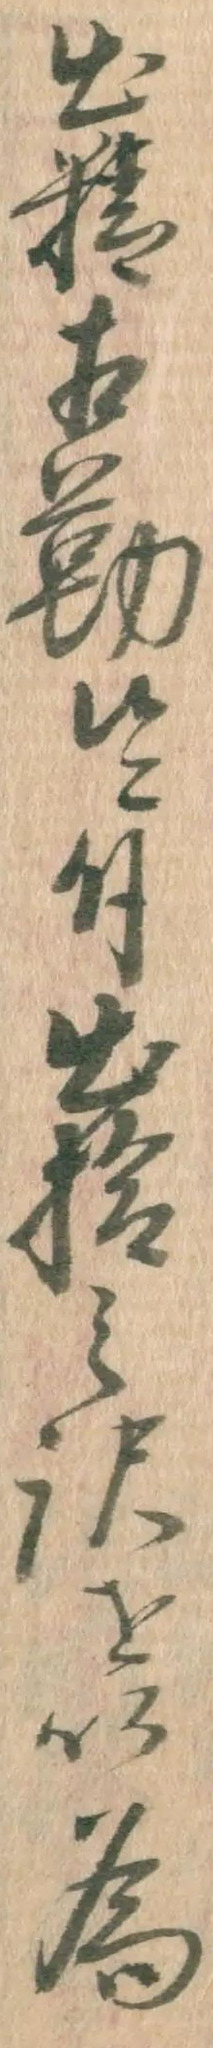出精相勤候ニ付出格之訳を以為
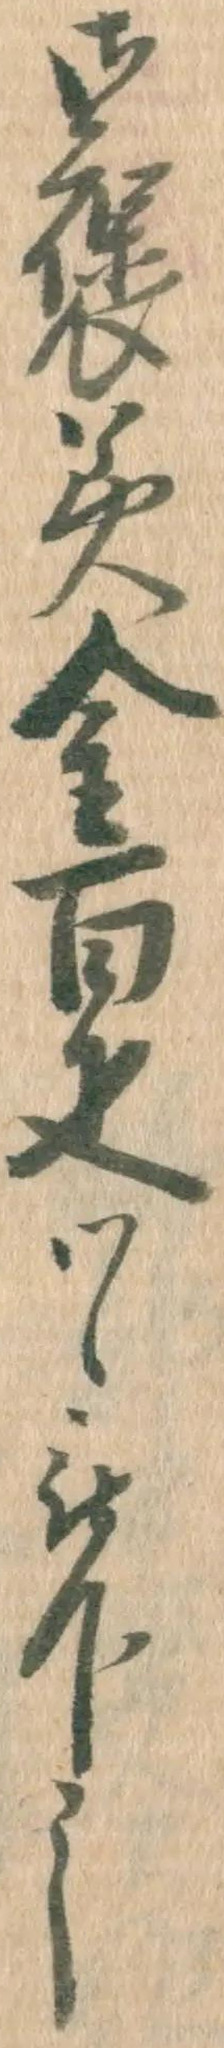御褒美金百疋ツヽ被下之

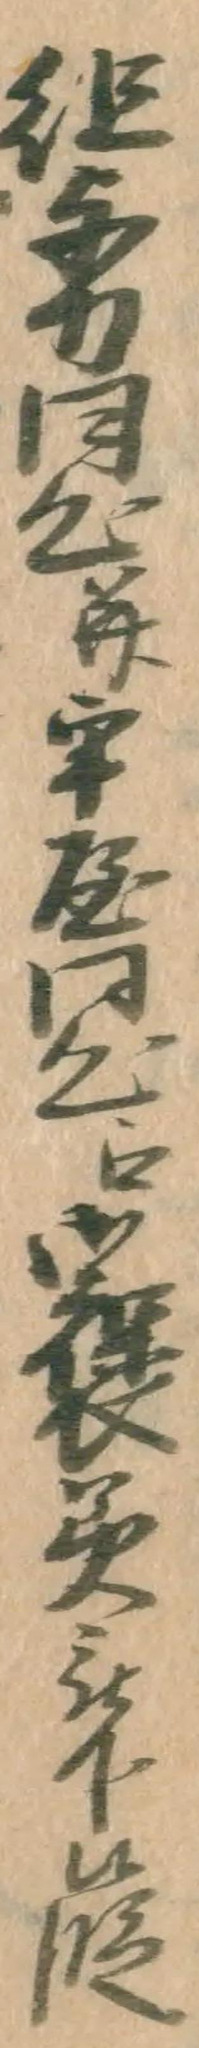│組与力同心幷牢屋同心え御褒美被下候段
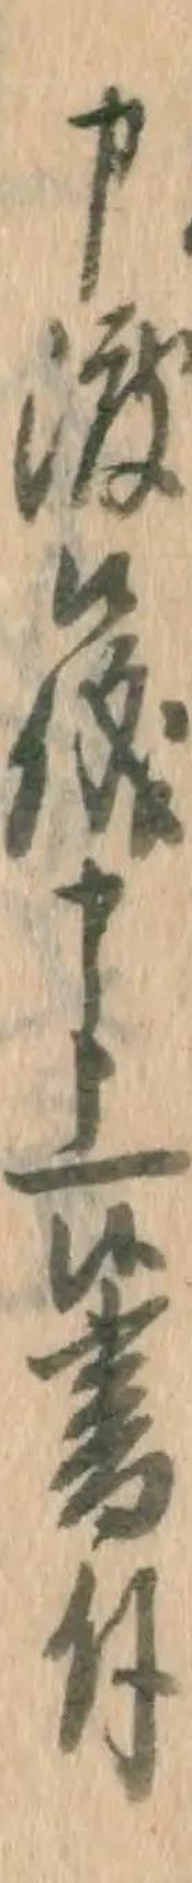│申渡候儀申上候書付
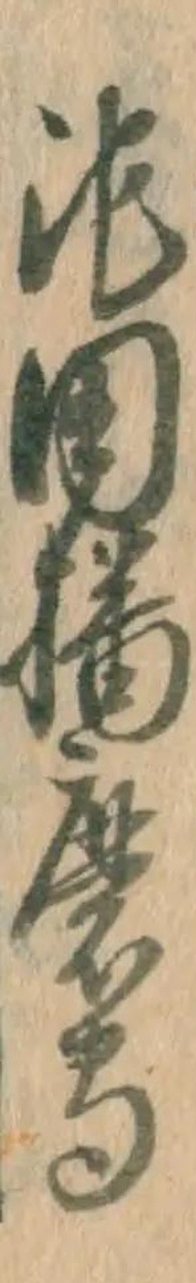│池田播磨守
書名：七十冊物類集 71巻. [44] 四十三 牢屋敷御普請御修覆地震ニ付骨折候牢屋掛御褒美之部
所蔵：国立国会図書館 National Diet Library, JAPAN
